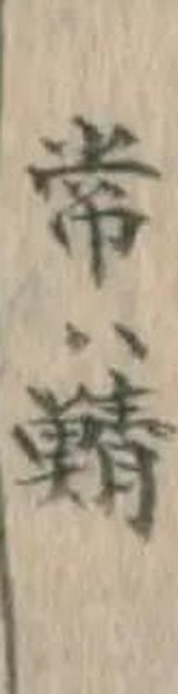常ハ鯖
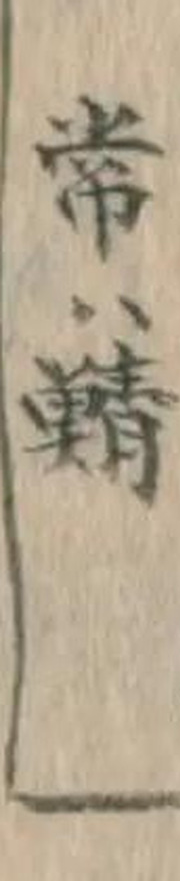常ハ鯖
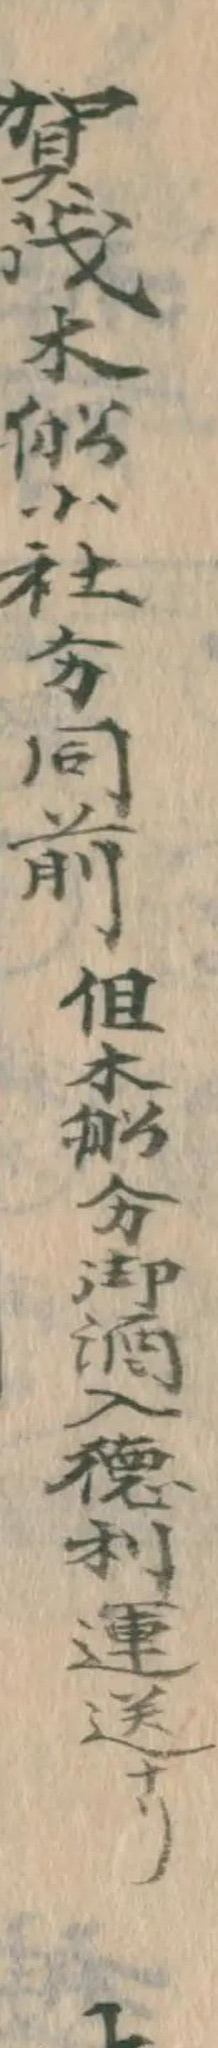賀茂木船小社分同前但木船分御酒入徳利運送ナリ本宮添御料
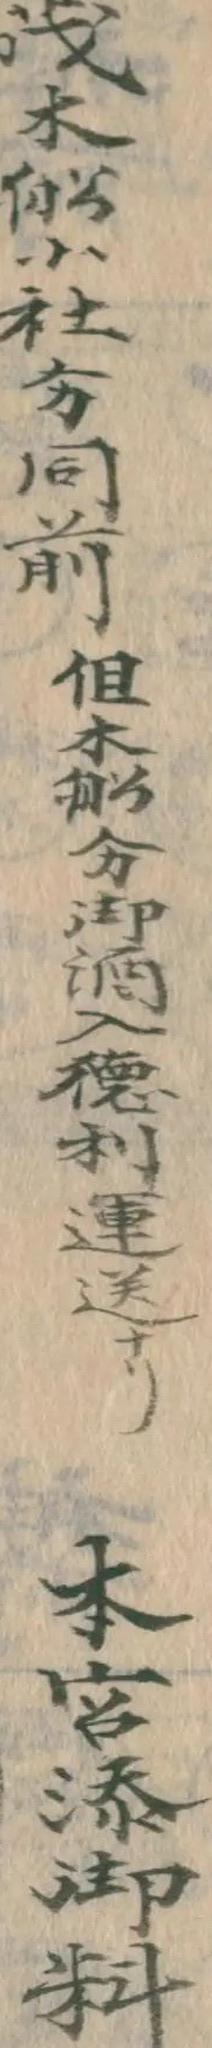賀茂木船小社分同前但木船分御酒入徳利運送ナリ本宮添御料
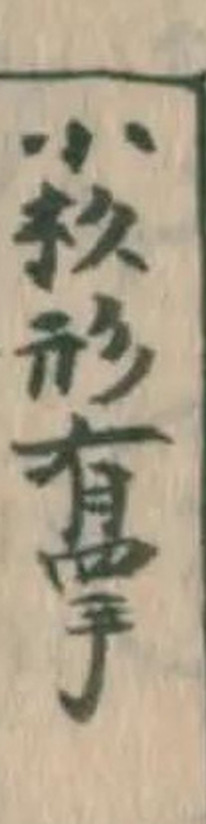小杉形有四手
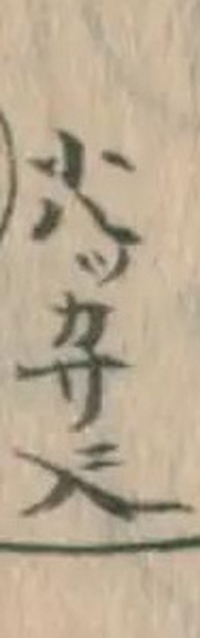小八ツカサニ入
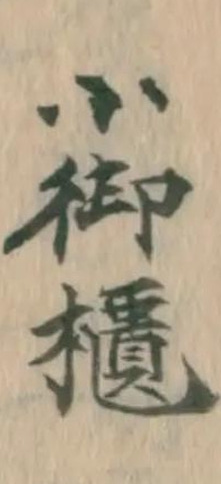小御櫃
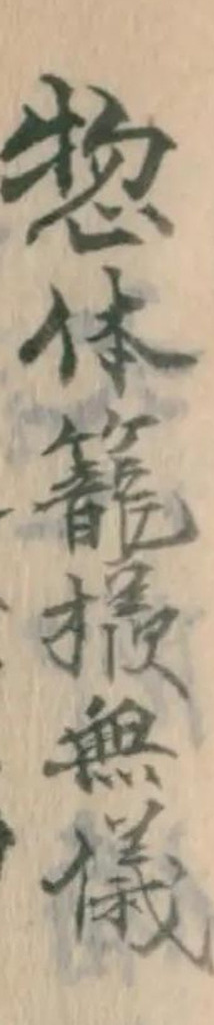惣体籠様無儀
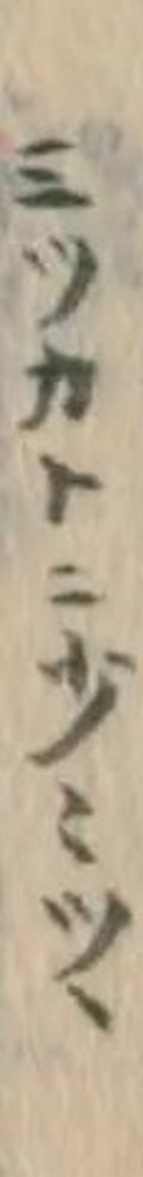三ツカトニ少々ツヽ
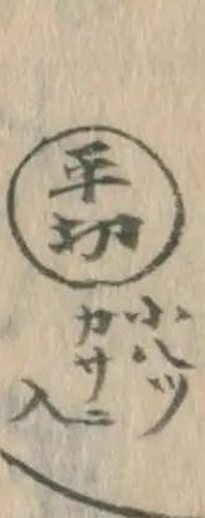カサニ

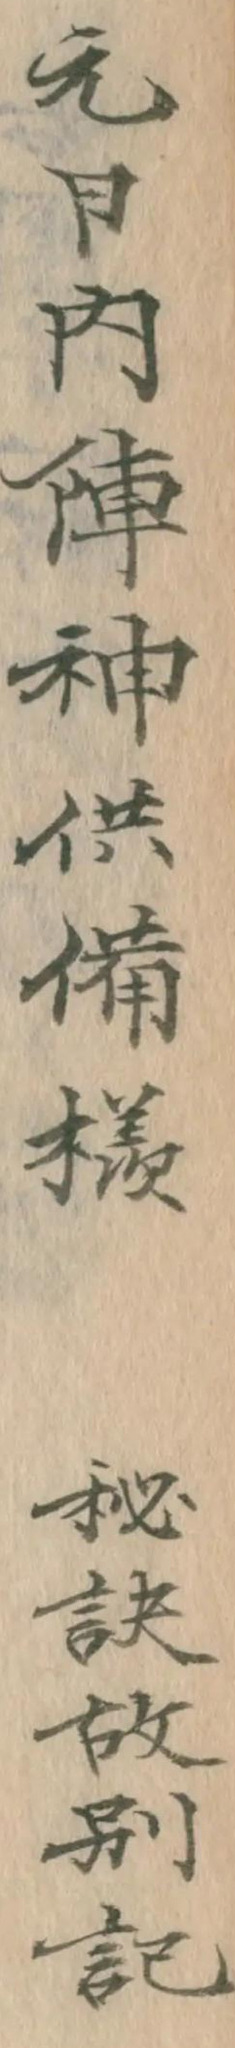元日内陣神供備様秘訣故別記
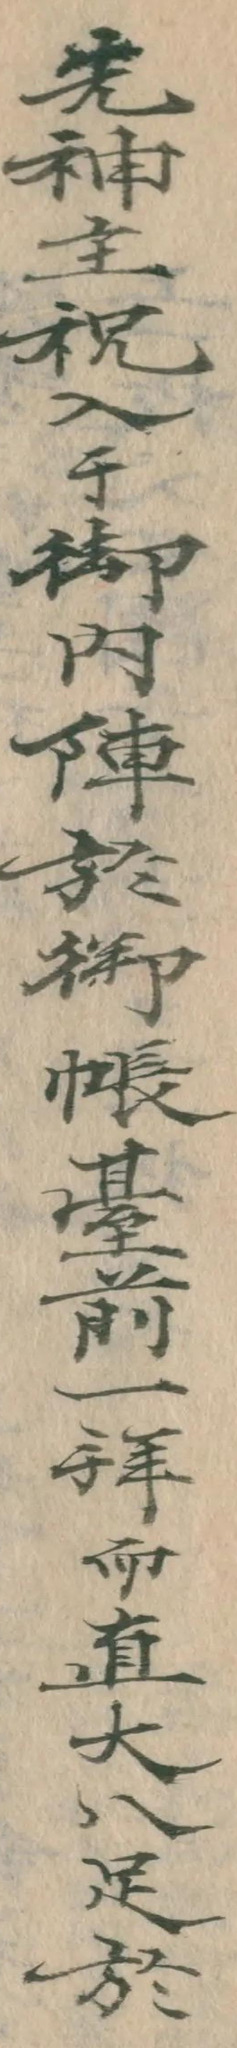先神主祝入于御内陣於御帳台前一拝而直大八足於
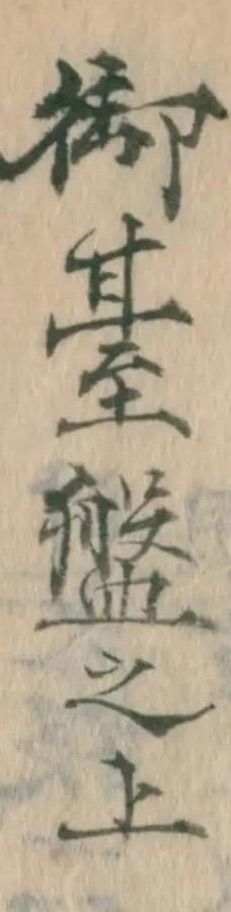御台盤之上
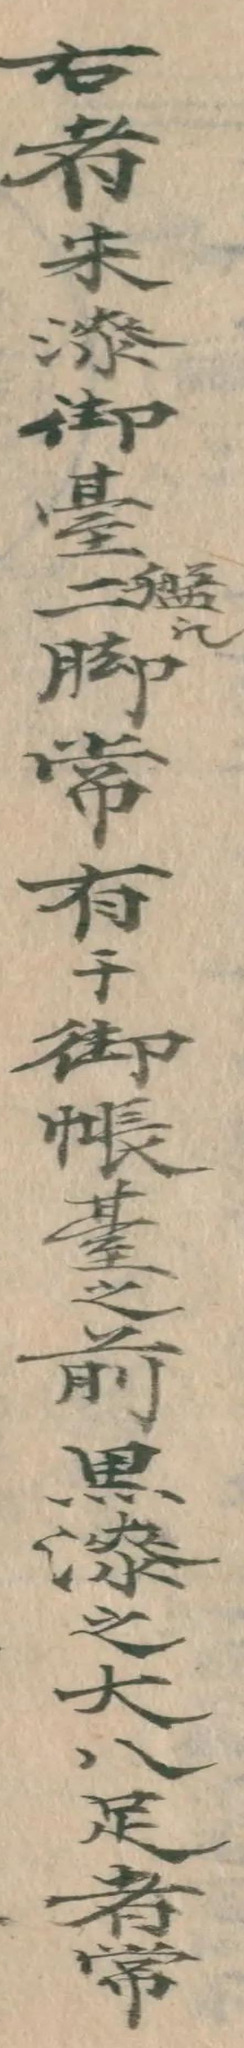右者朱漆御台二脚常有于御帳台之前黒漆之大八足者常
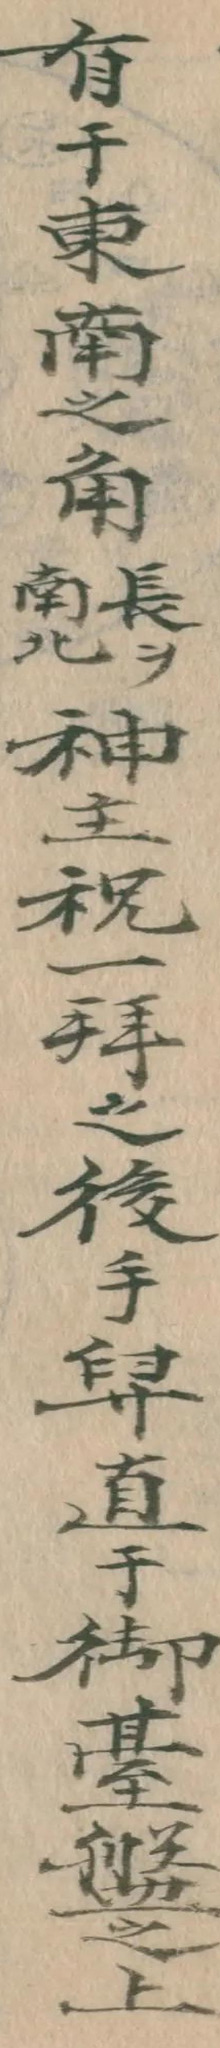有于東南之角長ヲ南北神主祝一拝之後手舁直于御台盤之上
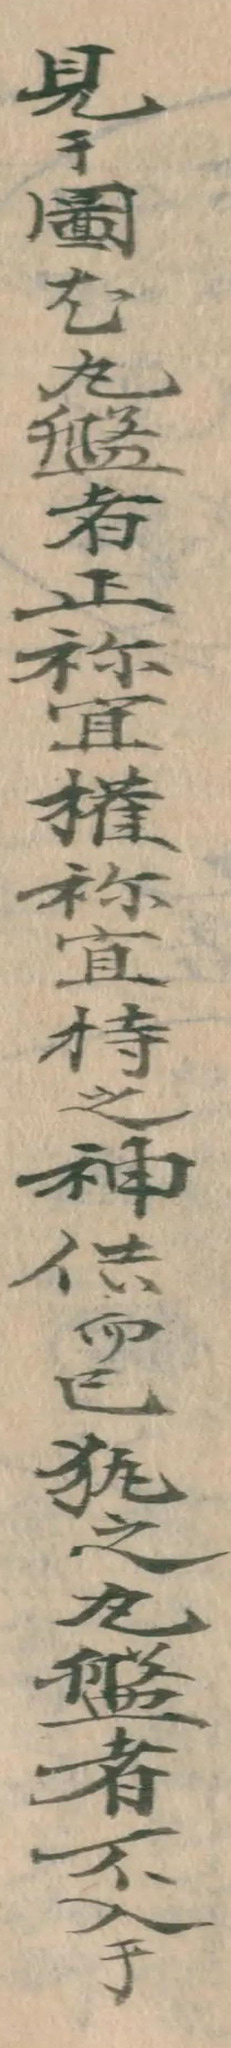見于図尤丸盤者正祢宜権祢宜持之神供而已執之丸盤者不入于
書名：賀茂社記録. 第9冊
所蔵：国立国会図書館 National Diet Library, JAPAN
